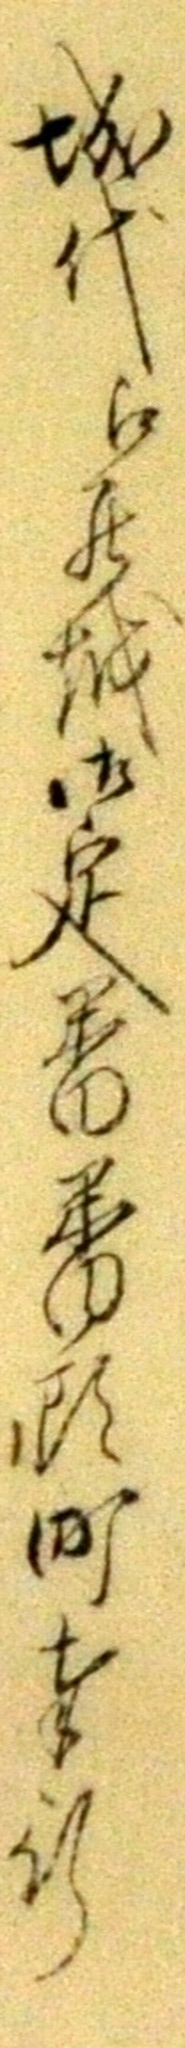城代え罷越御定番番頭町奉行
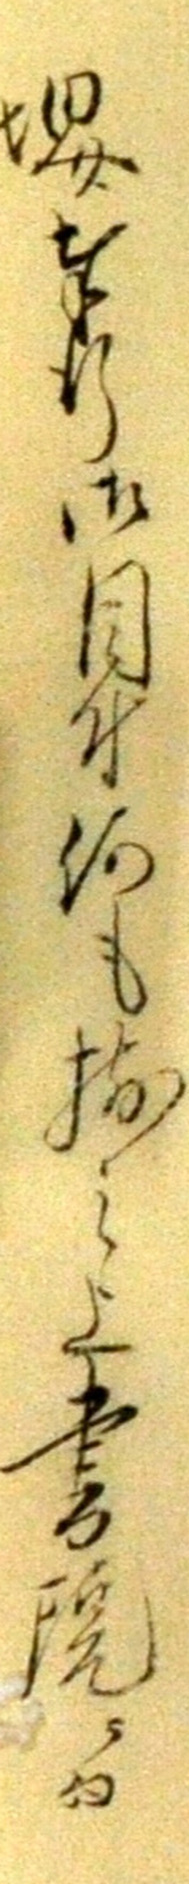堺奉行御目付何も揃之上書院ニ而

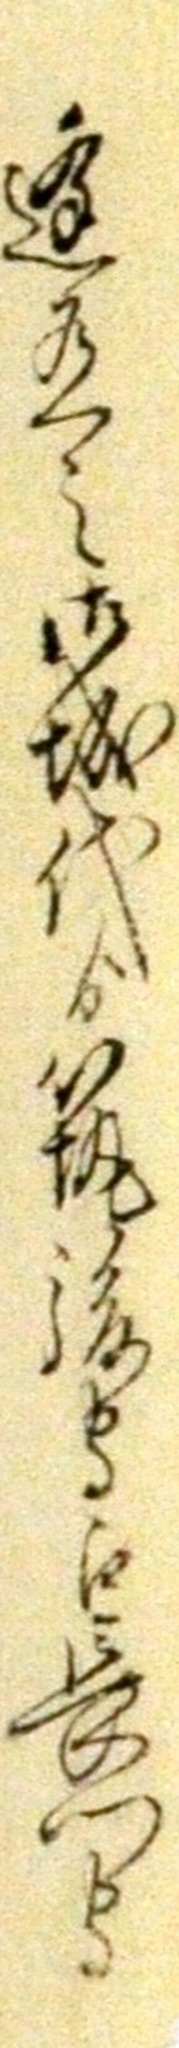逢有之御城代ゟ筑後守え長門守
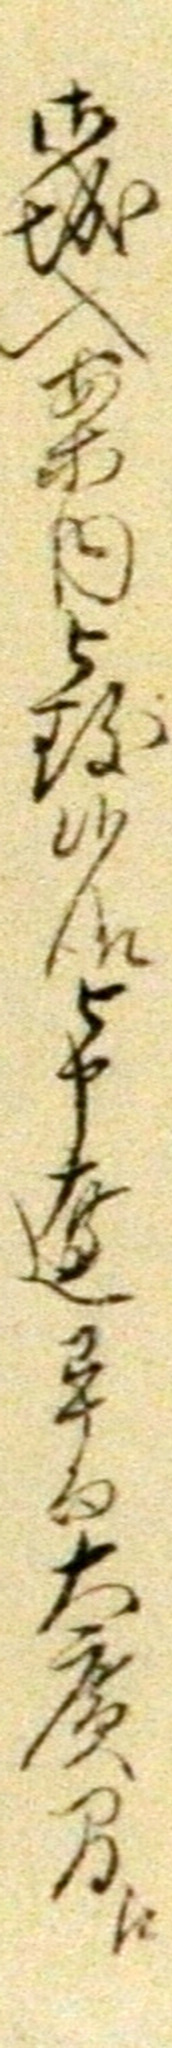御城入案内被致候様被申達畢而大広間え
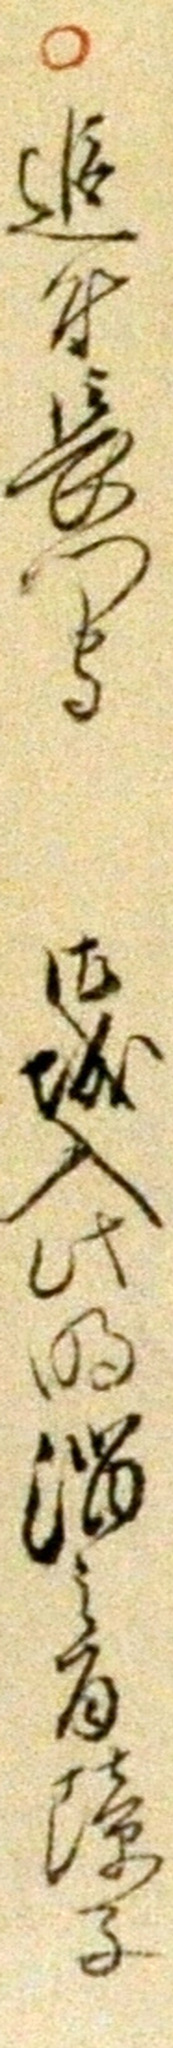追付長門守御城入此明溜之間障子
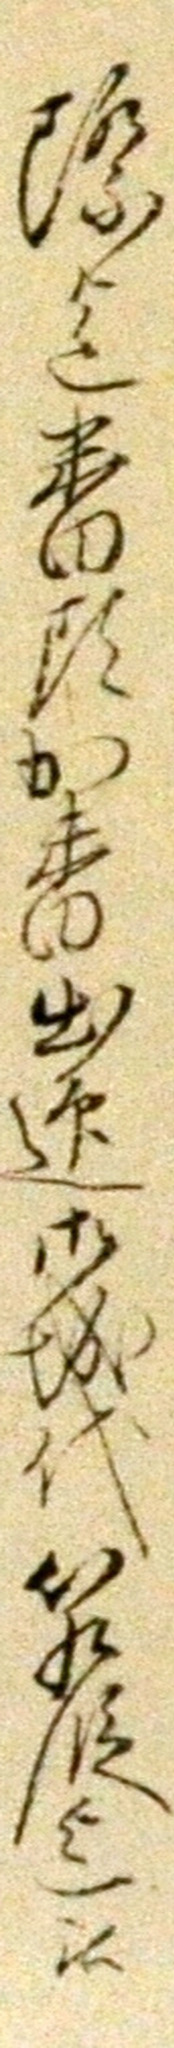際迄番頭加番出迎御城代箱段迄被
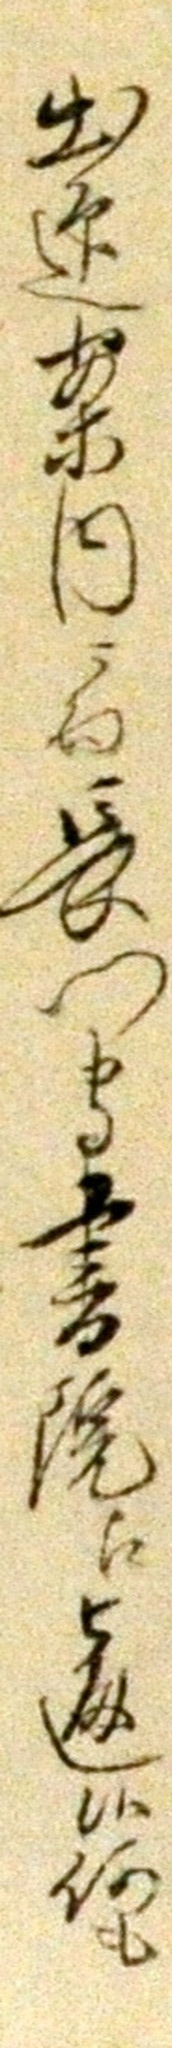出迎案内ニ而長門守書院え被通候何も
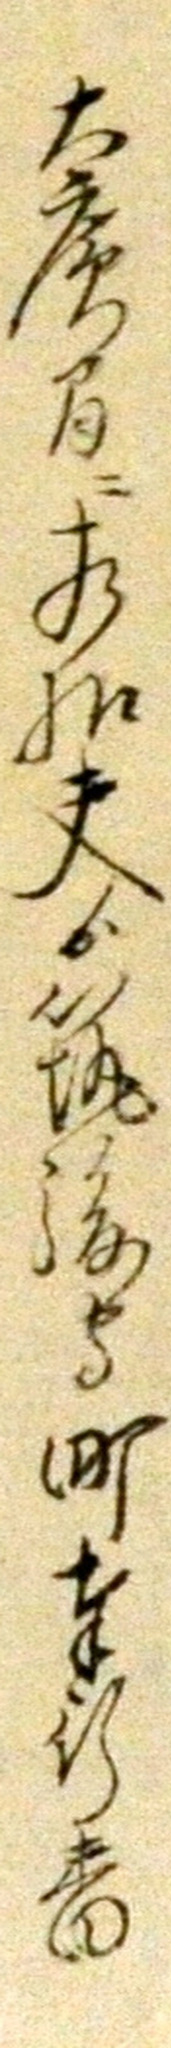大広間ニ相扣夫ゟ筑後守町奉行番
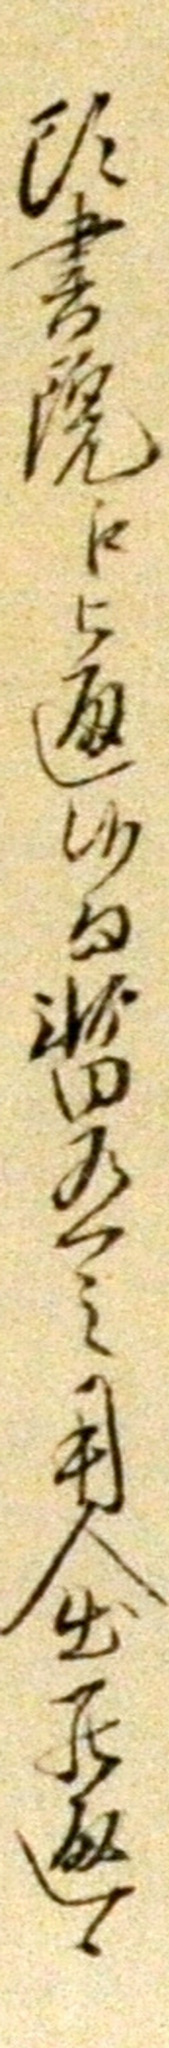頭書院え被通候而暫有之用人出罷通候
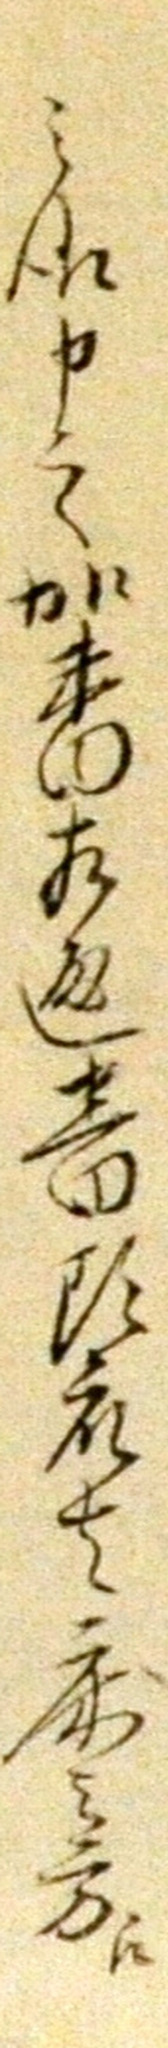之様申之加番相通番頭衆は床之方え
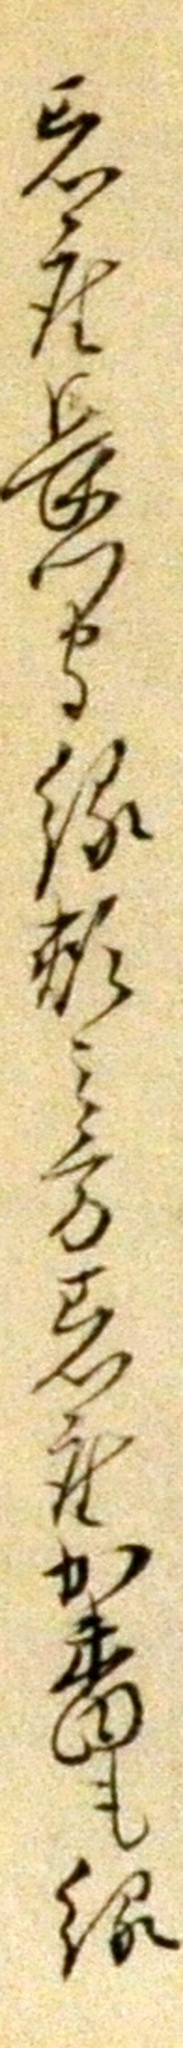着座長門守縁頬之方着座加番も縁
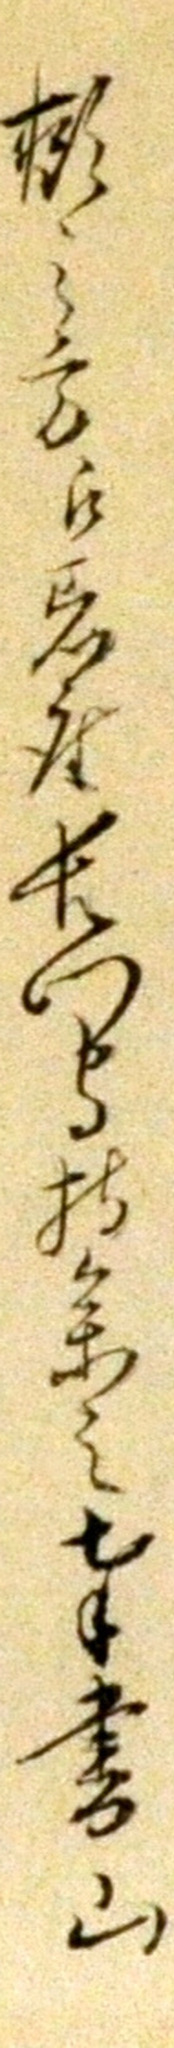頬之方え着座長門守持参之奉書山
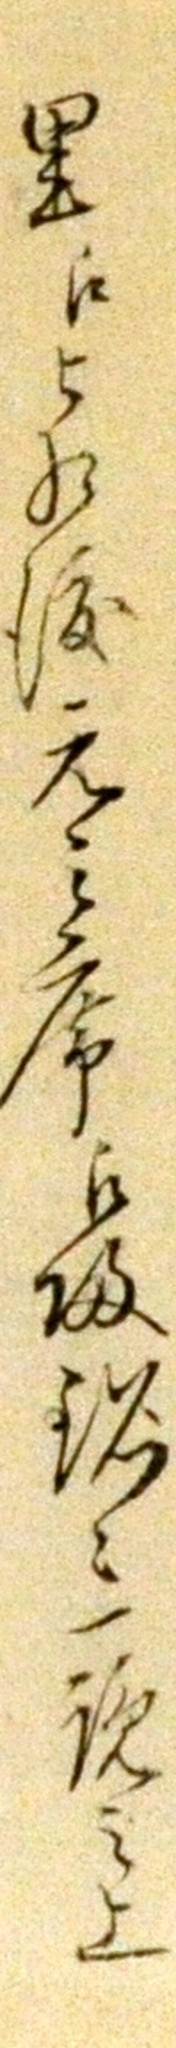里え被相渡元之席え帰銘々一覧之上
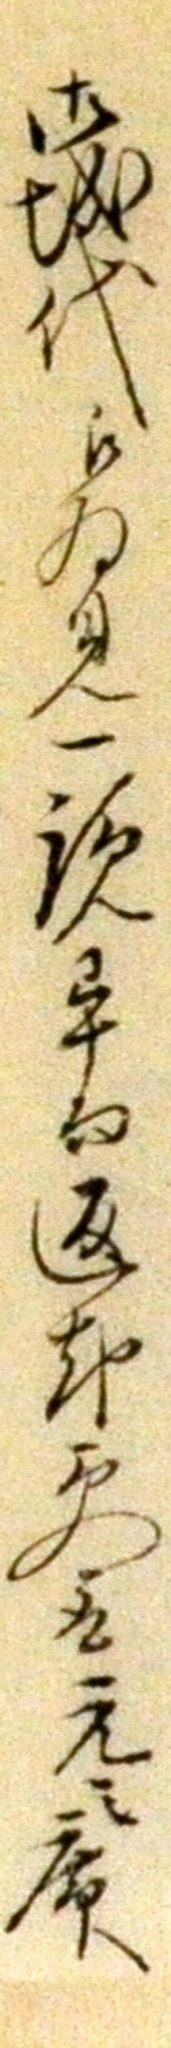御城代え為見一覧畢而返却受取元之席へ
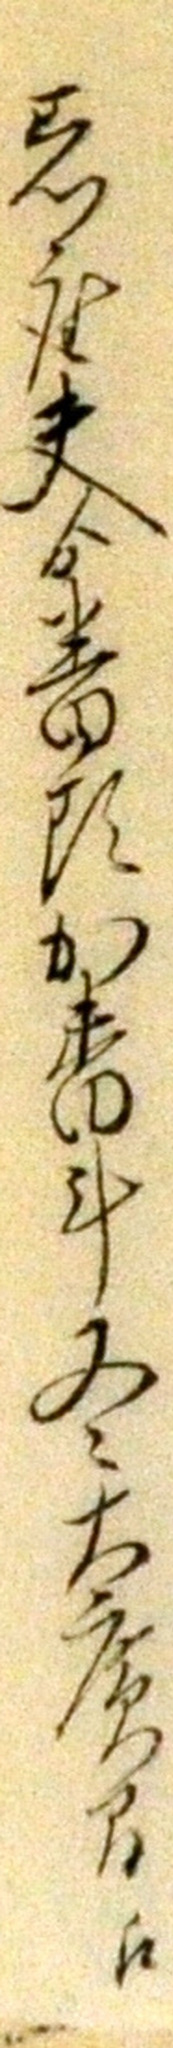着座夫ゟ番頭加番計又々大広間え
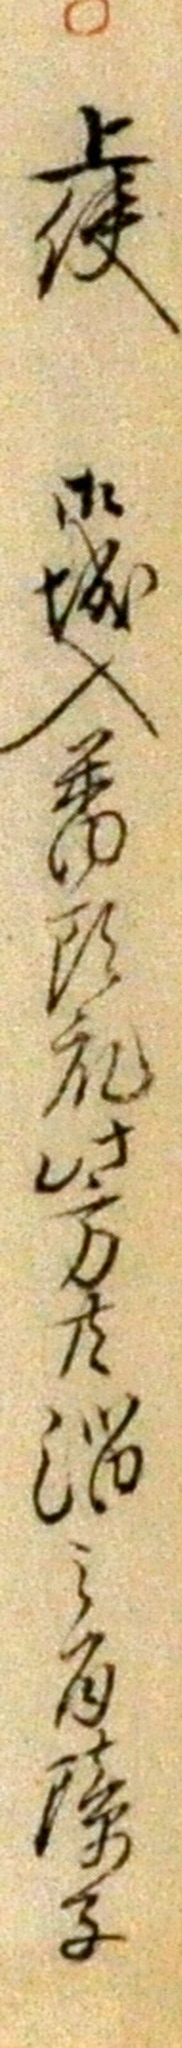上使御城入番頭衆此方共溜之間障子
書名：大阪加番関係諸書留〔一括〕
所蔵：伊那市立高遠町図書館・合同会社AMANE
